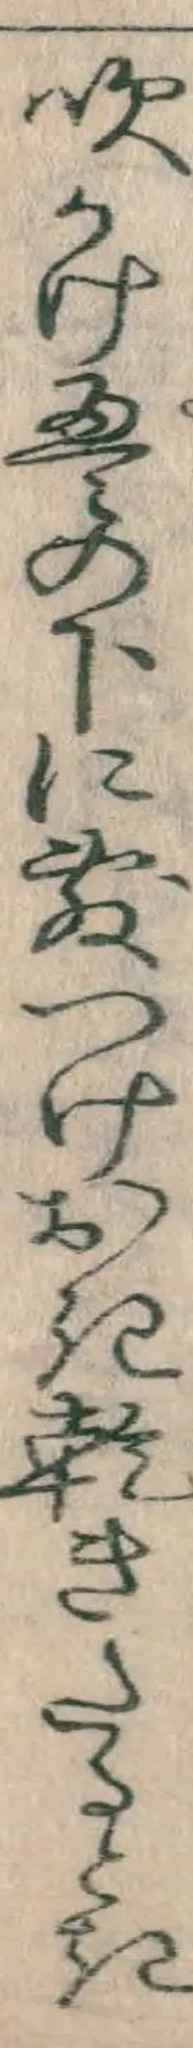吹かけ畳の下に敷つけおき乾きたるとき
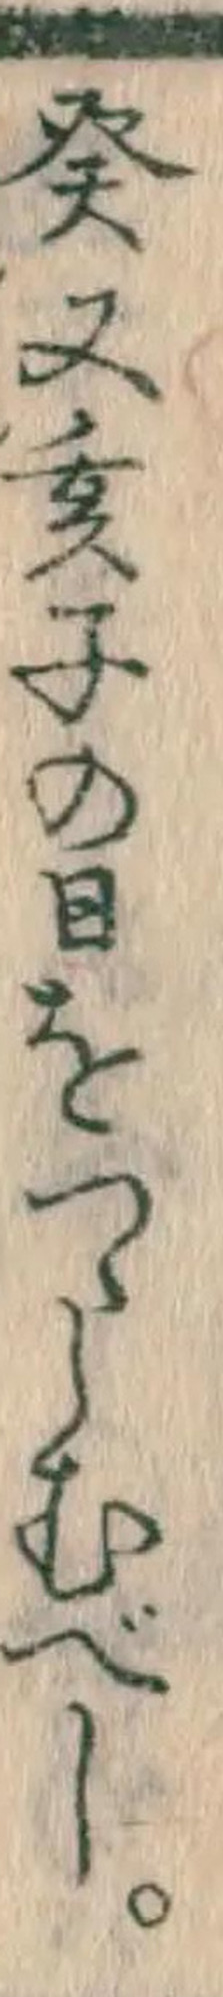癸又亥子の日をつゝしむべし。
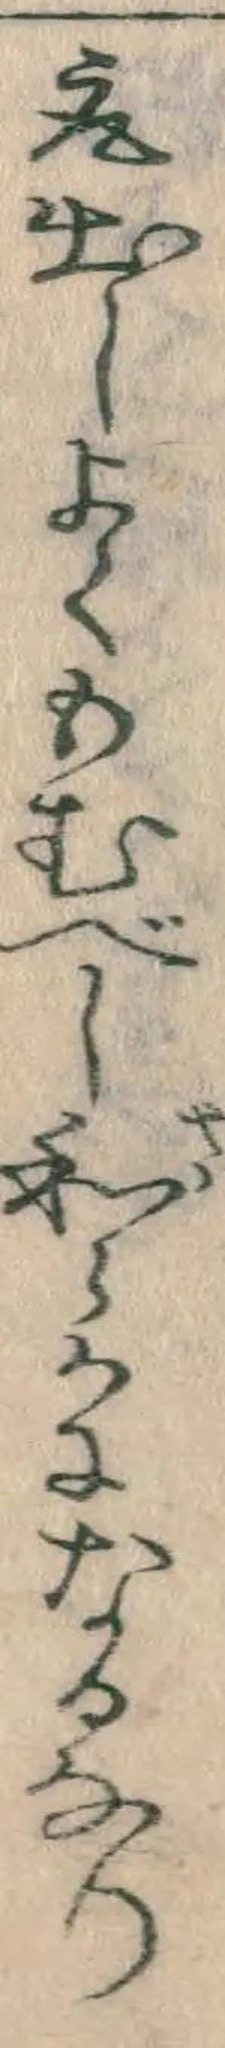取出しよくもむべし和らかになるなり
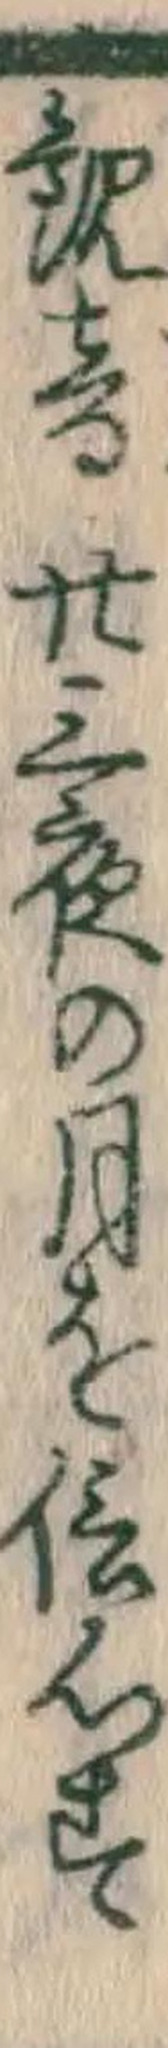観音廿三夜の月を信心す
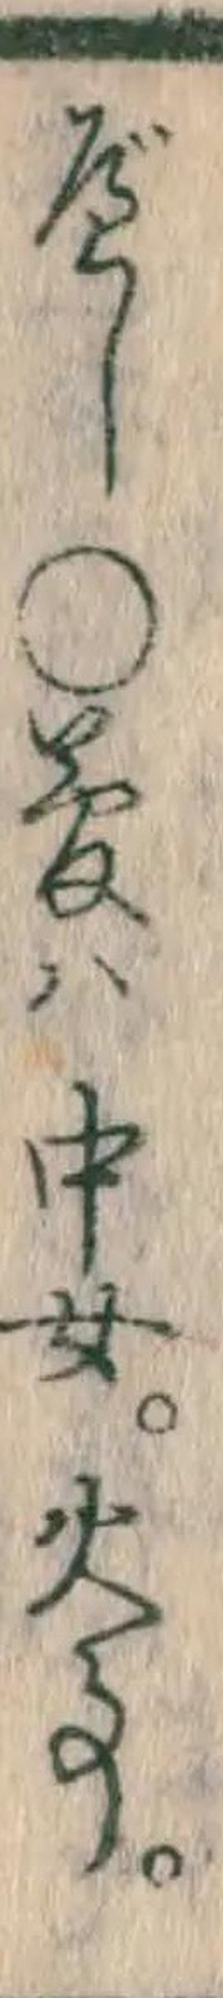べし○夢は中女。火事。
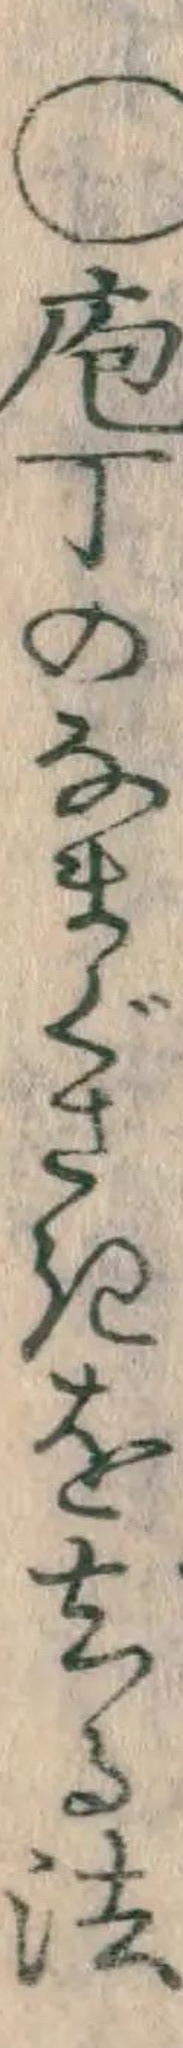○庖丁のなまぐさきを去る法
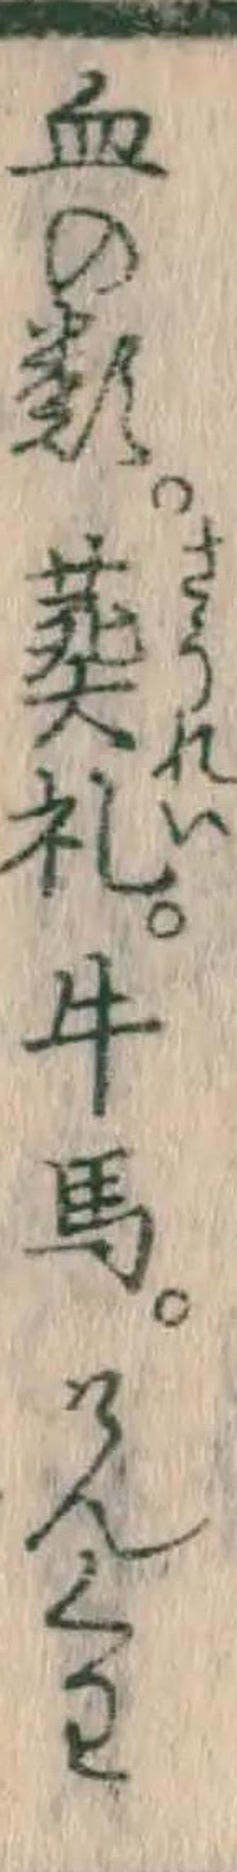血の類。葬礼。牛馬。けんくわ
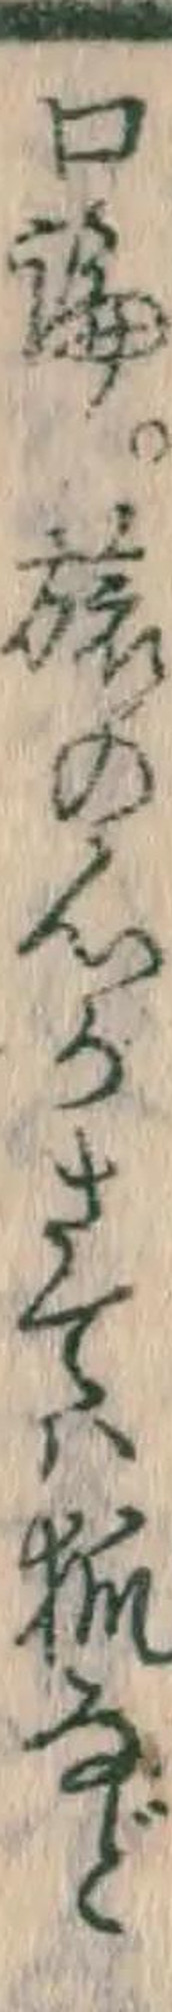口論。旅の心かさては狐など
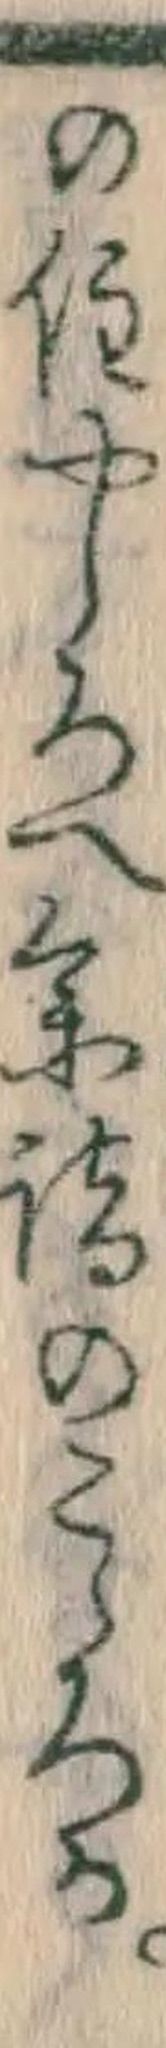の住やしろへ参詣のこゝろか。
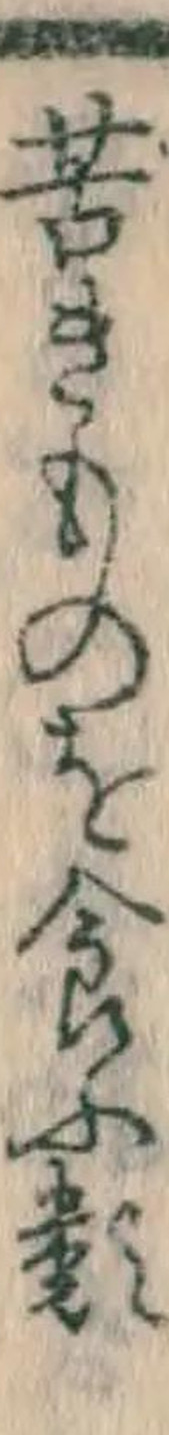苦きものを食ふ類
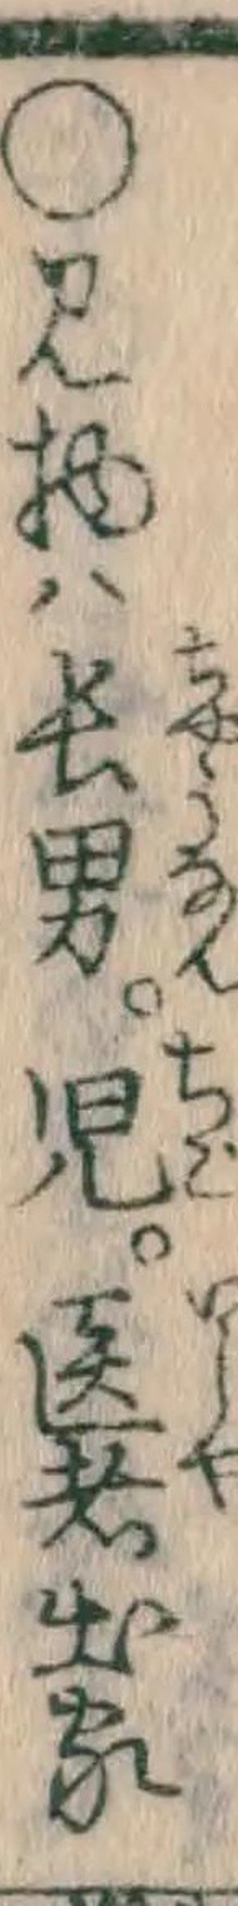○見物は長男。児。医者出家
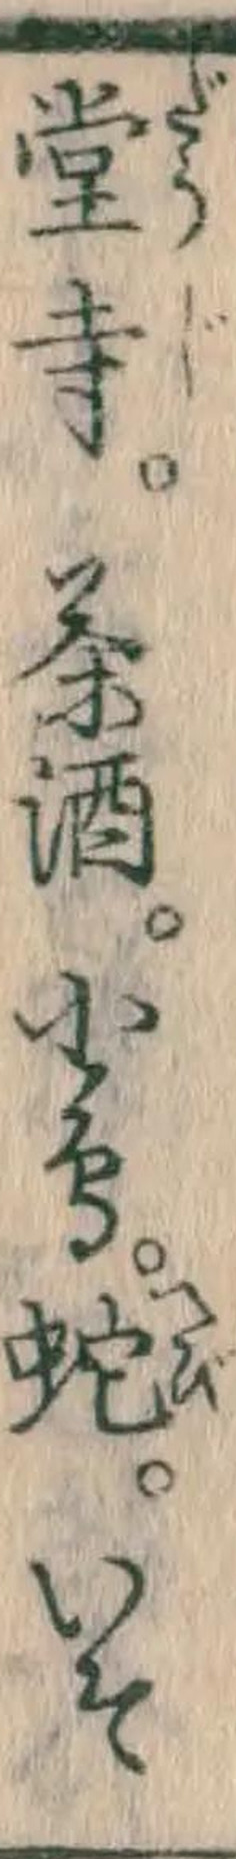堂寺。茶酒。小鳥。蛇。いそ
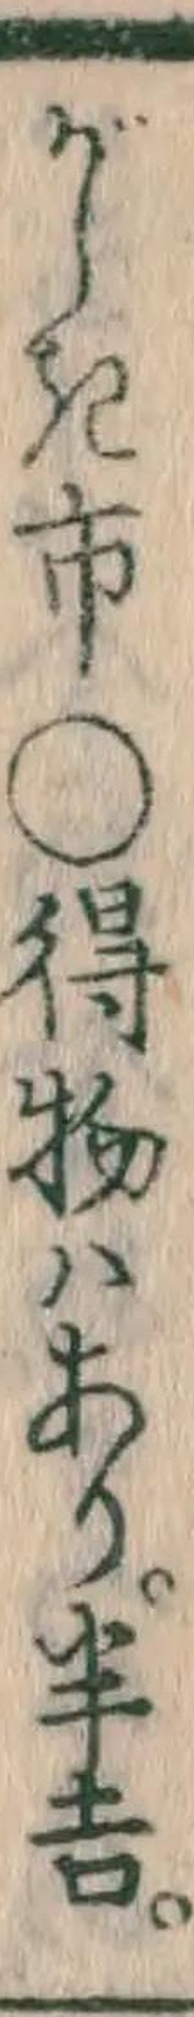がしき市○得物はあり。半吉。
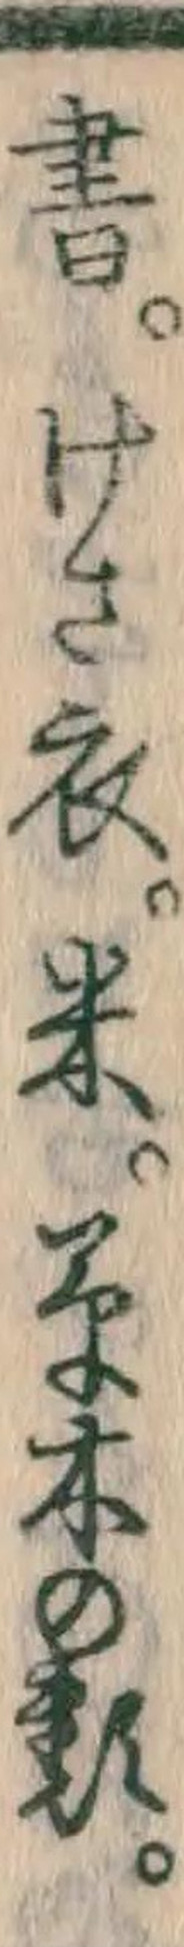書。けさ衣。米。草木の類。
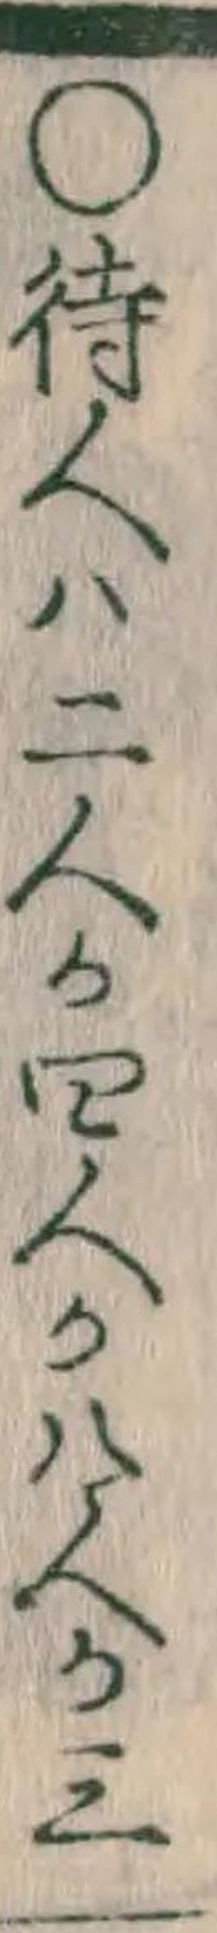○待人は二人か四人か八人か三
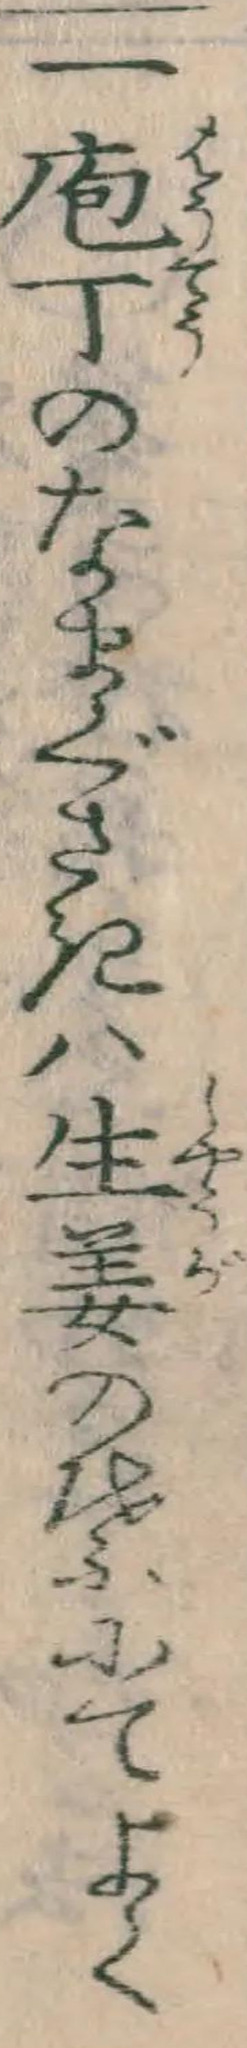一庖丁のなまぐさきは生姜の葉にてよく
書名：広益秘事大全 3巻. [1]
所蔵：国立国会図書館 National Diet Library, JAPAN
